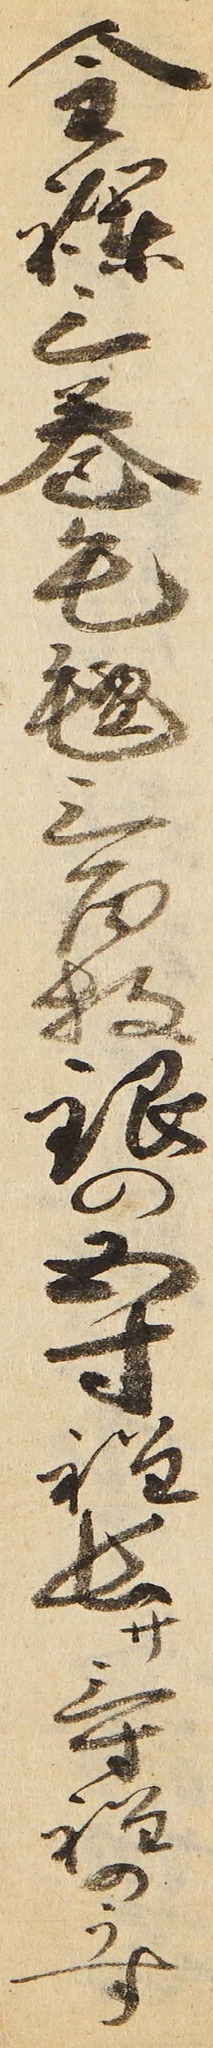金襴三巻毛氈三百枚銀の五寸程長さ三寸程のうす
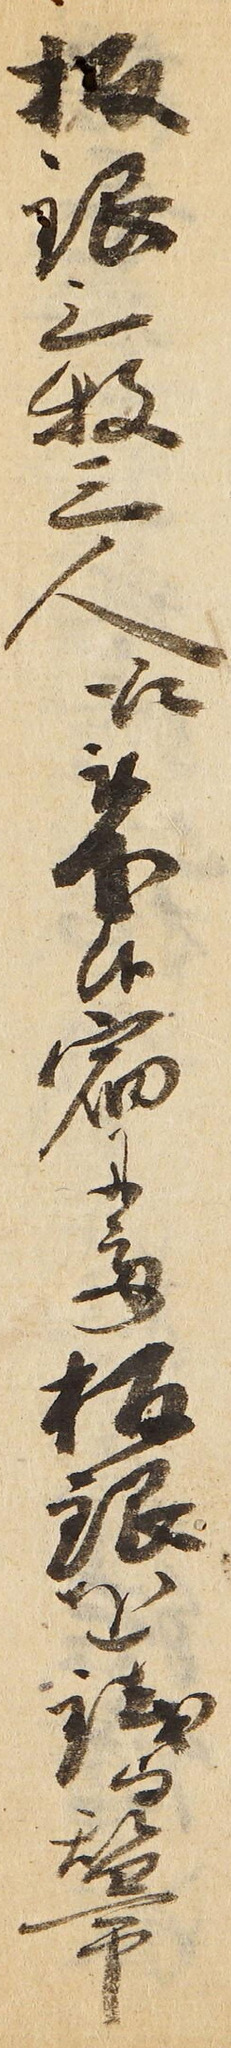板銀三枚三人え被下候宿にて板銀を銭と替可申
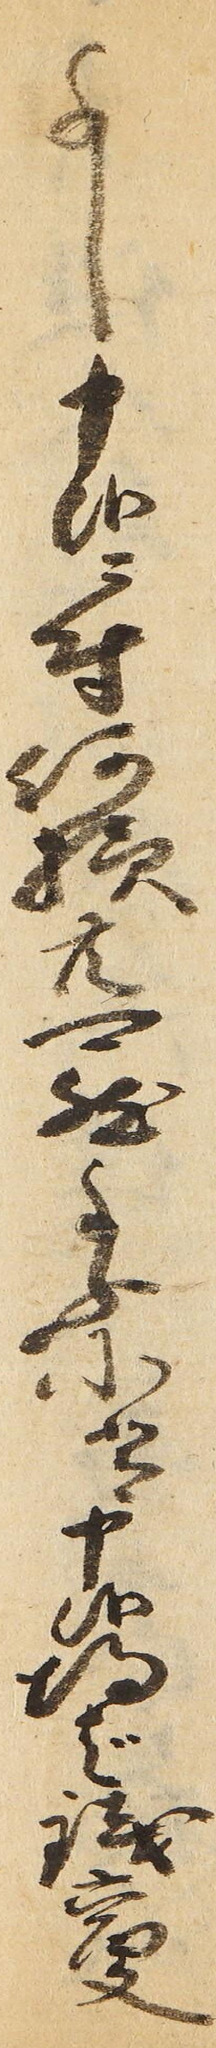よし申候に付何様共可然よふにと申候得ば銭六百文
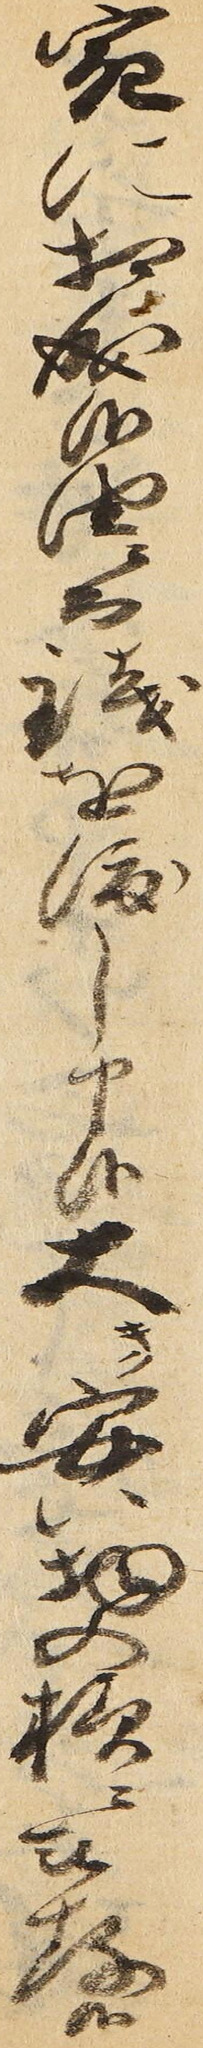宛に相成候由にて銭を渡し申候大きく安い物の様に被存候
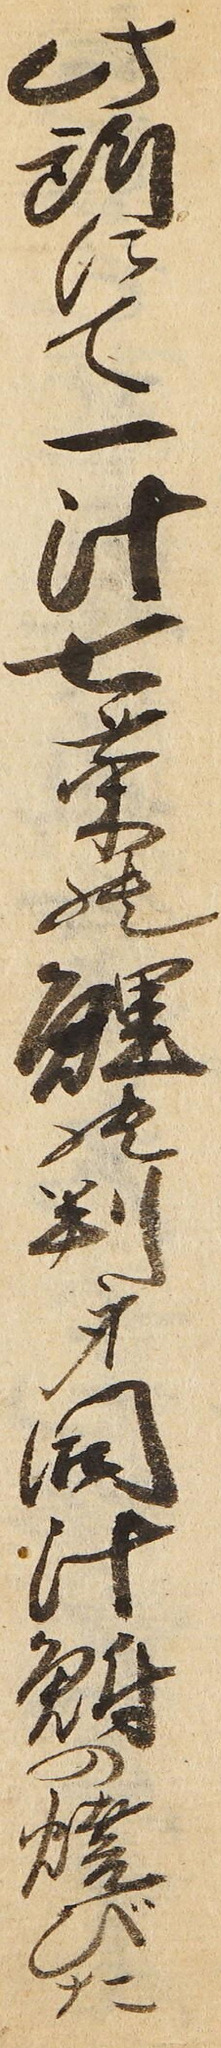此所にて一汁七菜の鯉の判身同汁鮒の焼びた
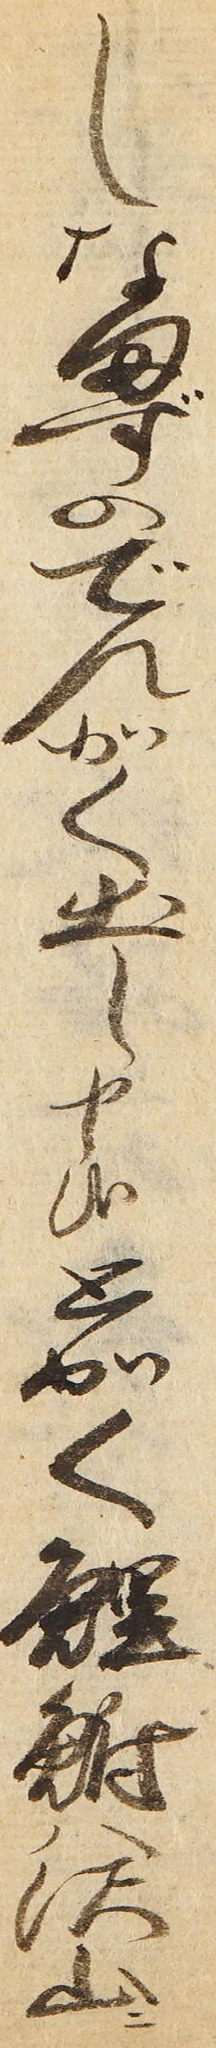しなまずのでんかく出し申候とかく鯉鮒は沢山に
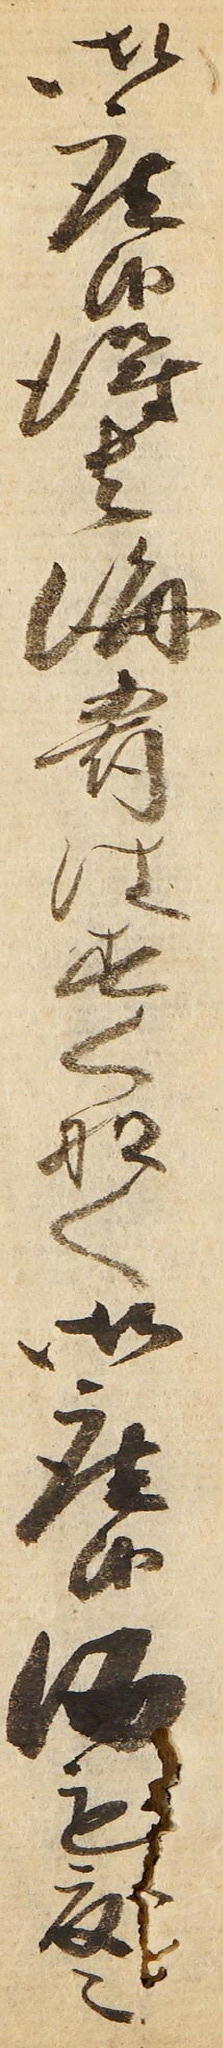御座候得は海肴はすくなく御座候酒も度々
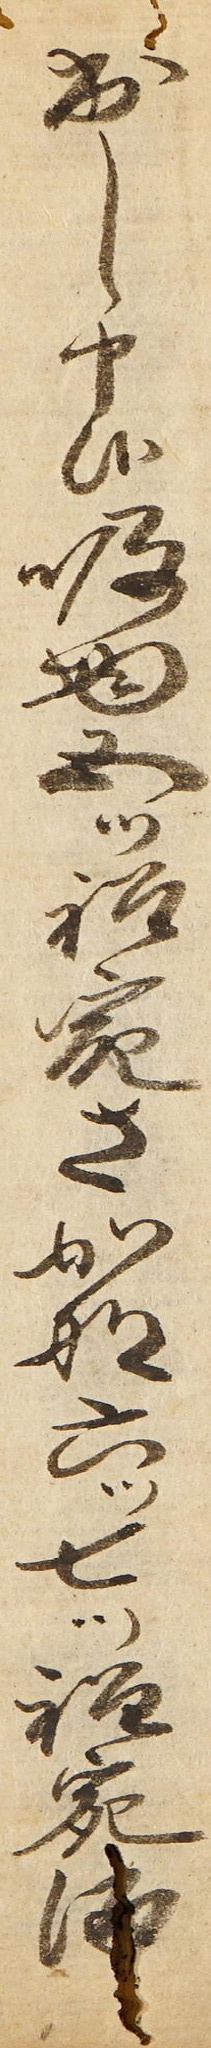出し申候吸物五ツ程宛さかな六ツ七ツ程宛酒
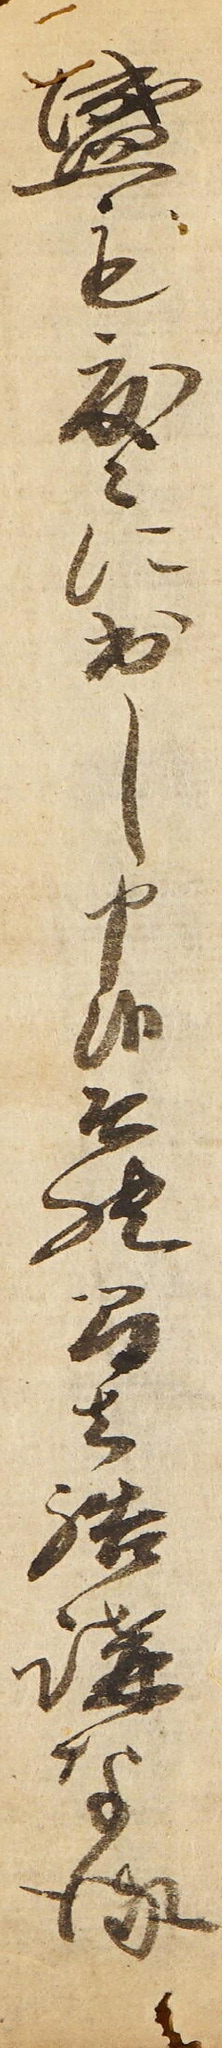盛も度々に出し申候その間は結構なる
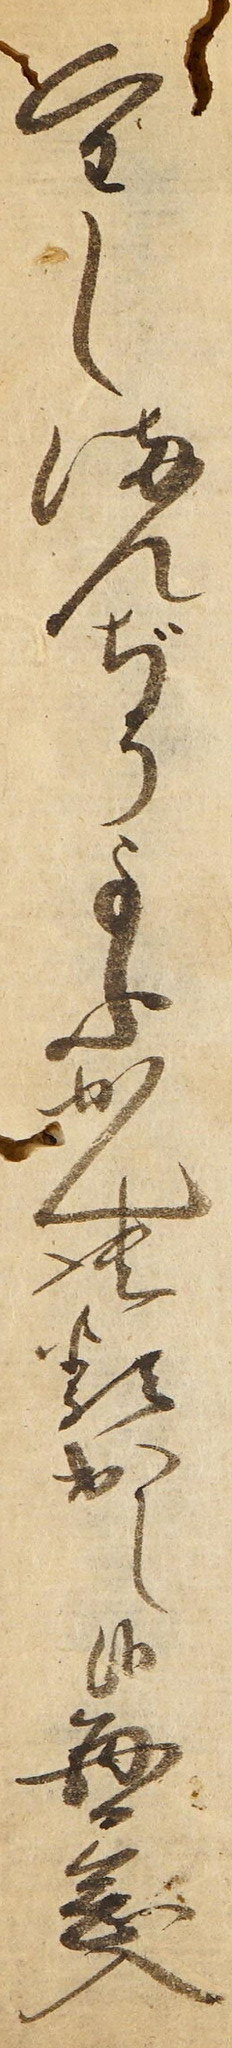くわしまんぢうようかんの類出し候毎日念入
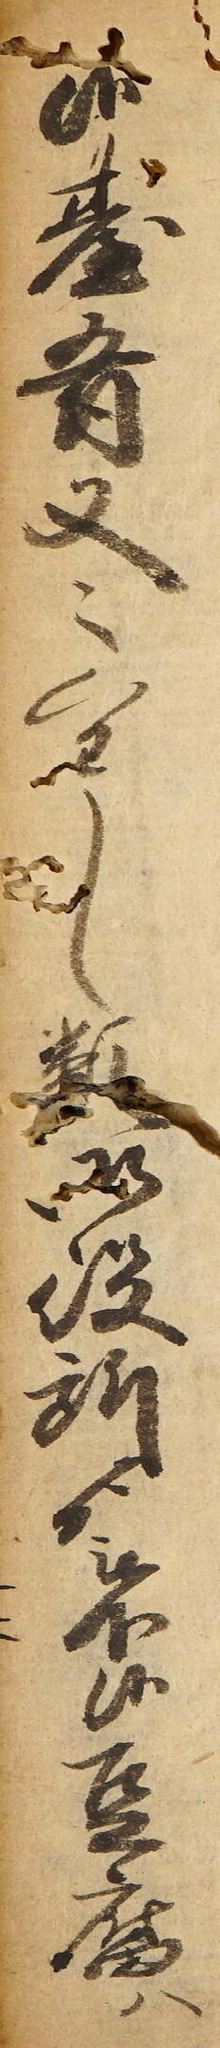候台肴又々くわし類御役所ゟ被下候豆腐は

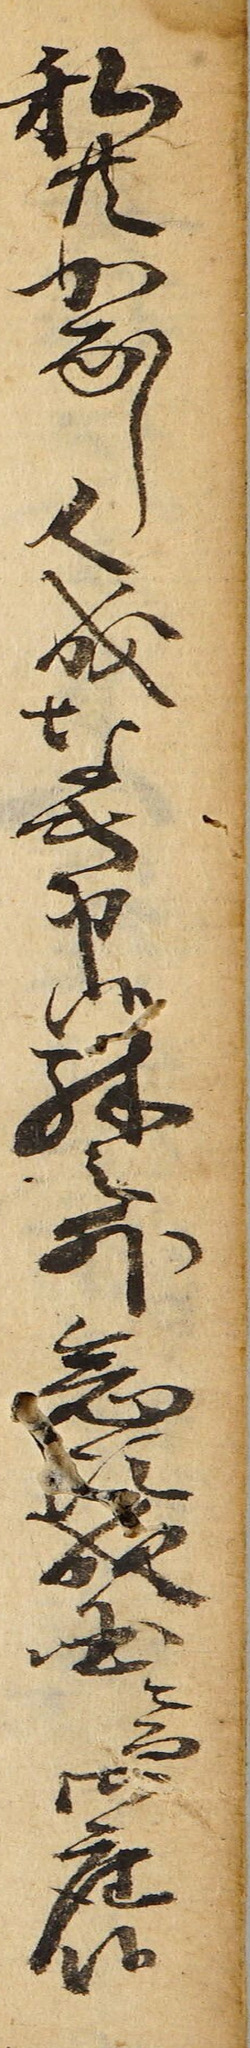私共かなしく成なき申候殊之外念頃成国にて御座候
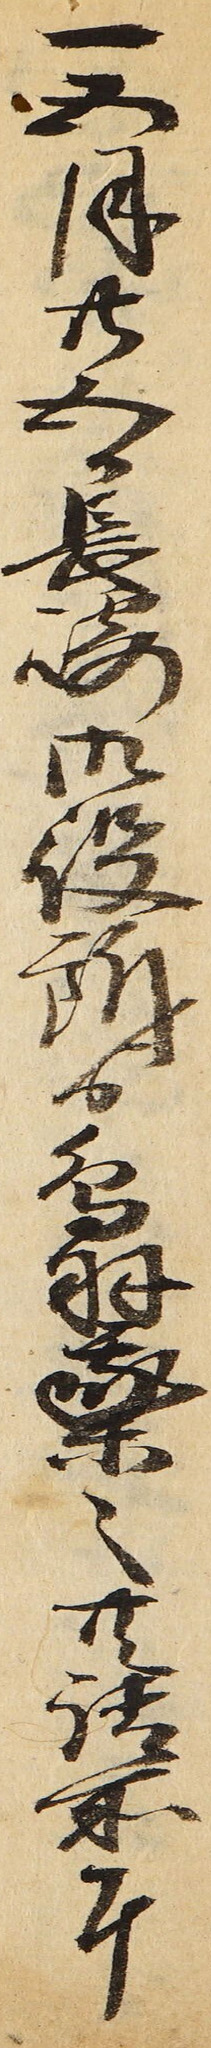一五月廿五日長崎御役所ゟ鳥羽家等之共詰所に
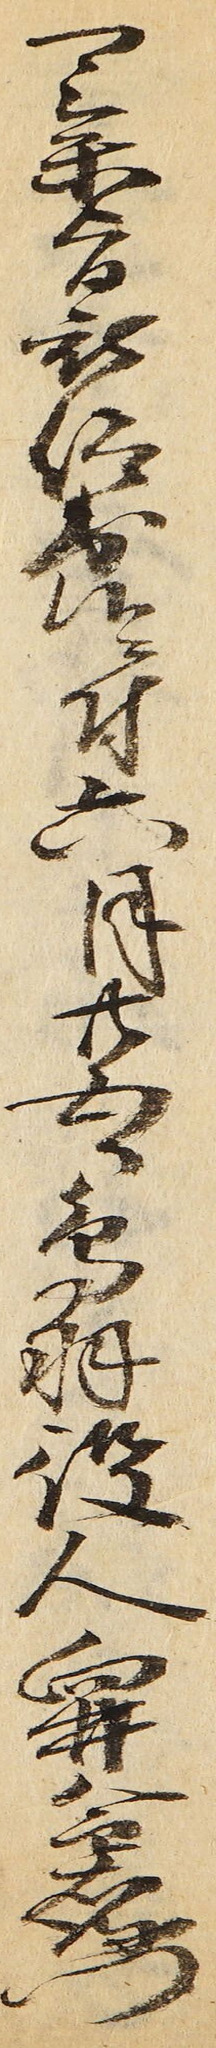可参旨被仰出候に付六月廿五日鳥羽役人向井八郎右衛門
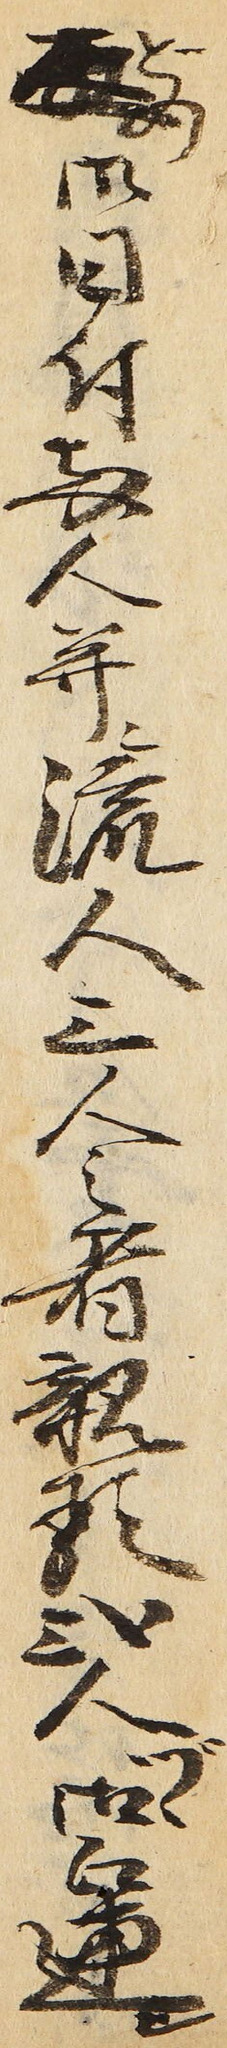どの御日付両人并に流人三人之者親類弐人ヅヽ御召連れ
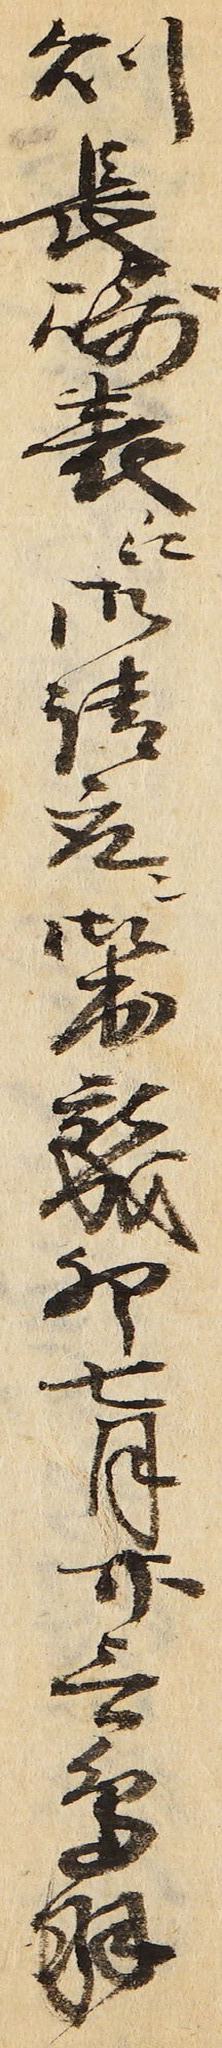則長崎表え御請取に御出被成卯七月廿三日鳥羽
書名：志州鳥羽流船留書
